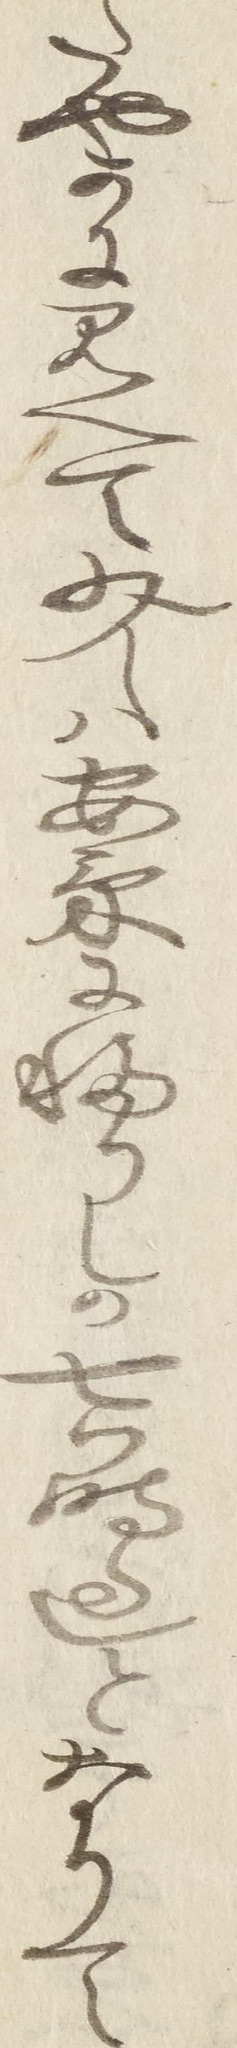たやかに見へて少しは安気に移りしの七ツ時過となりて
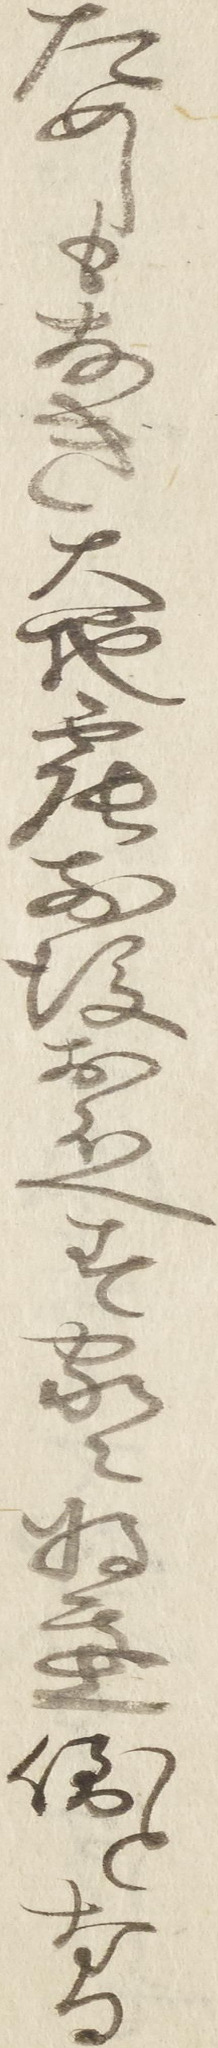ためしもなき大地震前後おほへす家々将戯倒となる
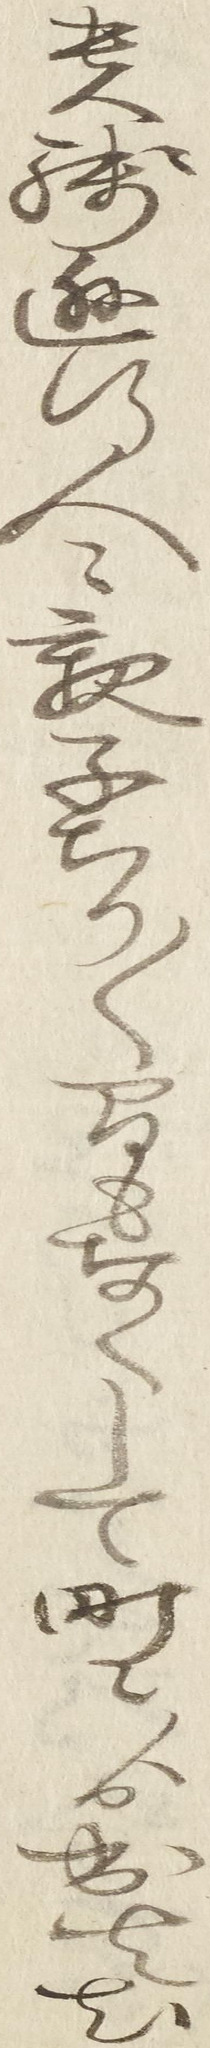貴賤逃行人々親子ちり〳〵間もなくして町々より出火尤
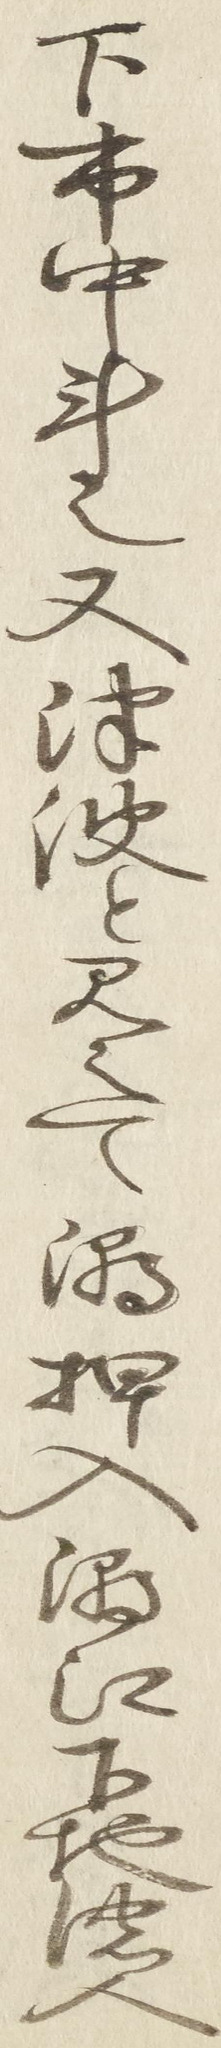下市中斗也又津波と見えて潮押入潮江下地濃人
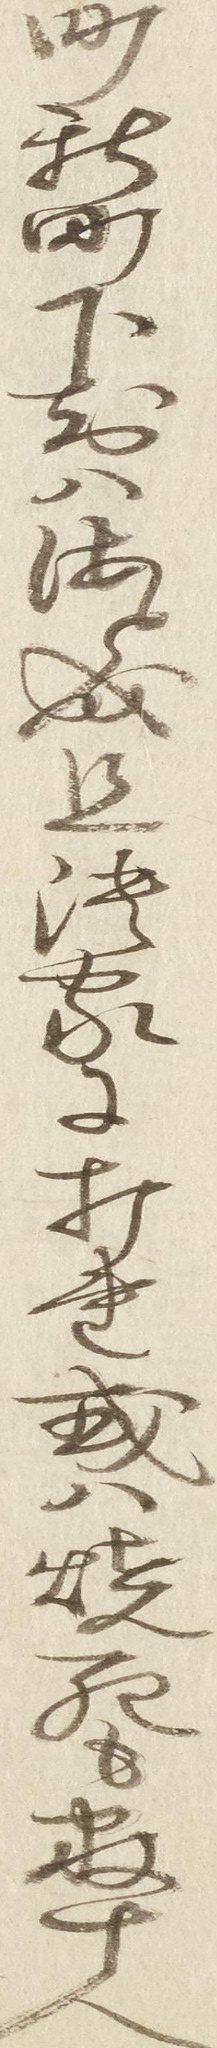町新町下前は海と成且潰家に打れ或は焼死も数十人
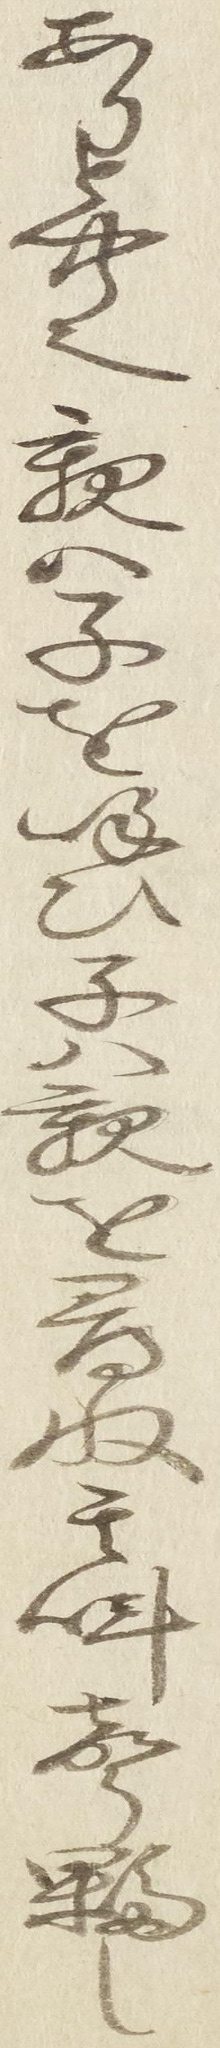ありと聞也親は子を呼び子は親を尋ね其叫声夥し
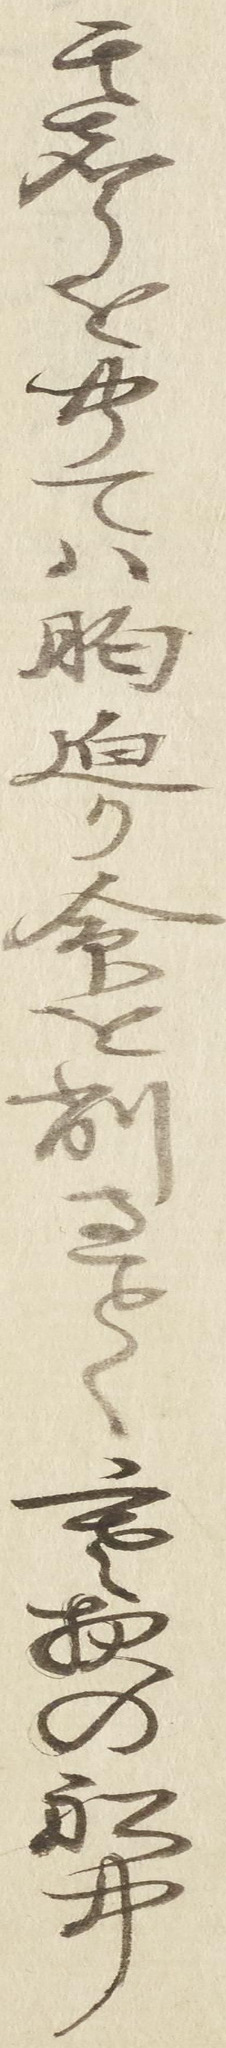其声を聞ては胸迫り命を削ることく寒夜の船中
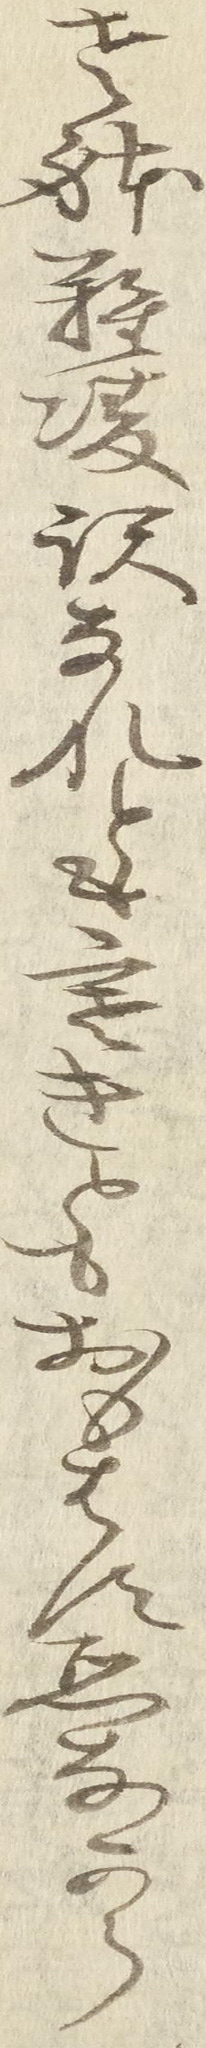老躰難凌訳なれとも寒きともおもはす恐なから
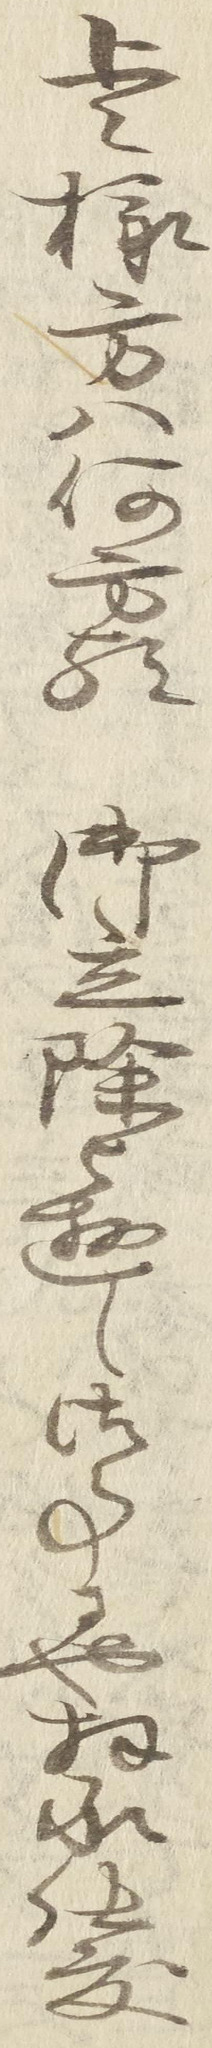上々様方は何方歟御立除被遊候御事にや拝承仕度
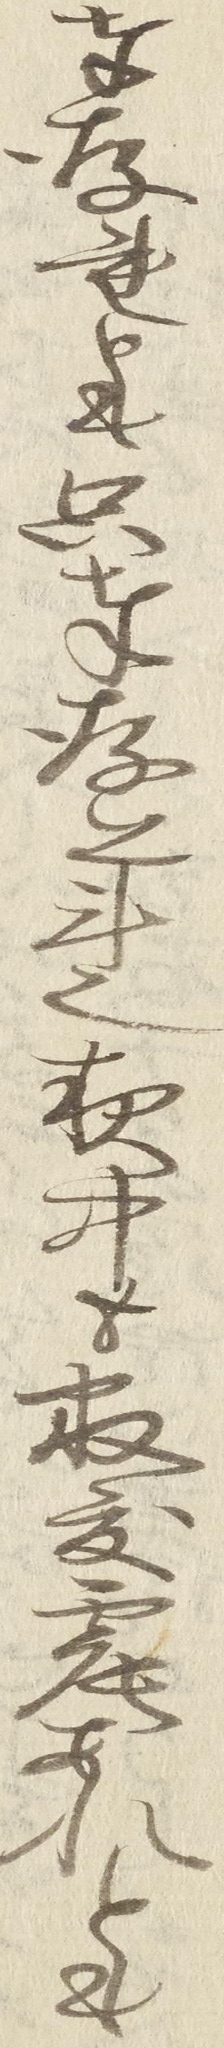奉存れとも只奉存と斗也夜中も数度震あれとも
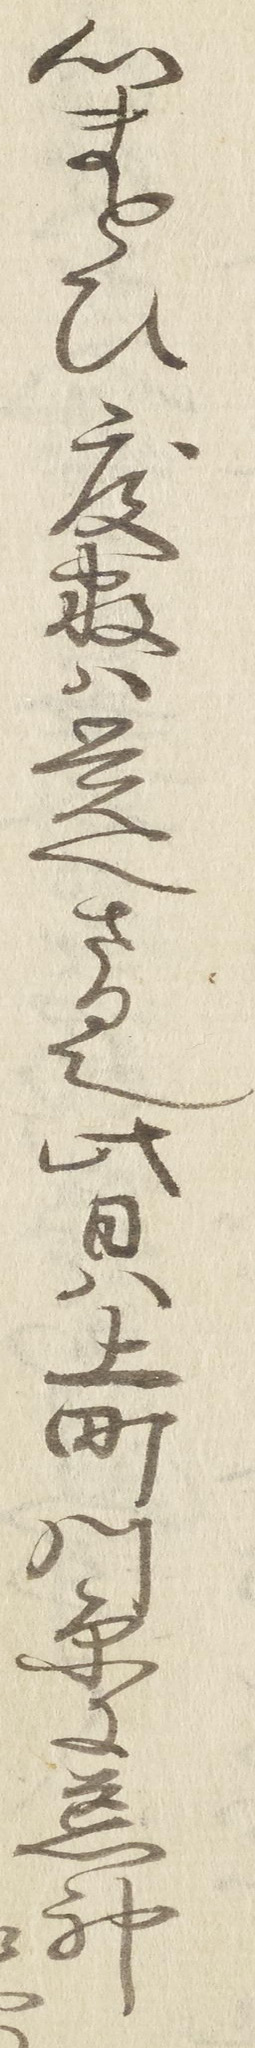心まとひ度数は覚へさる也此日は上町河原に荒紙祭の
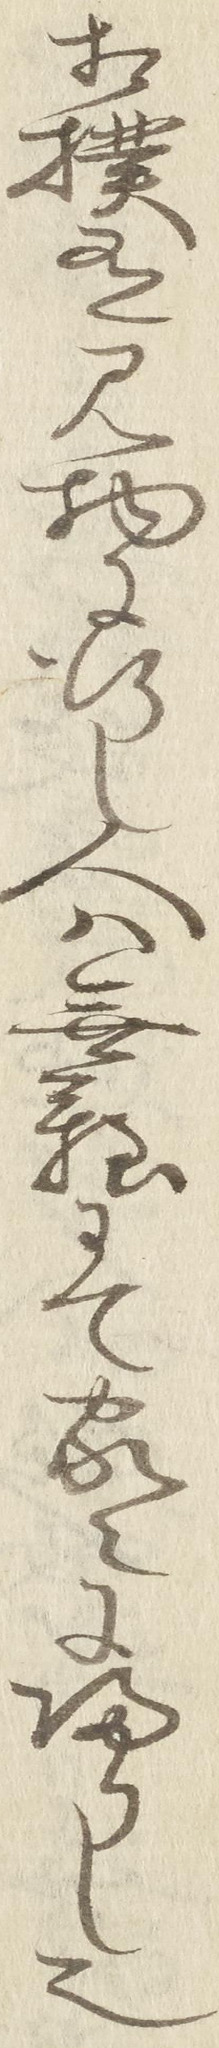相撲有見物に行し人は無難にて家々に帰りし也
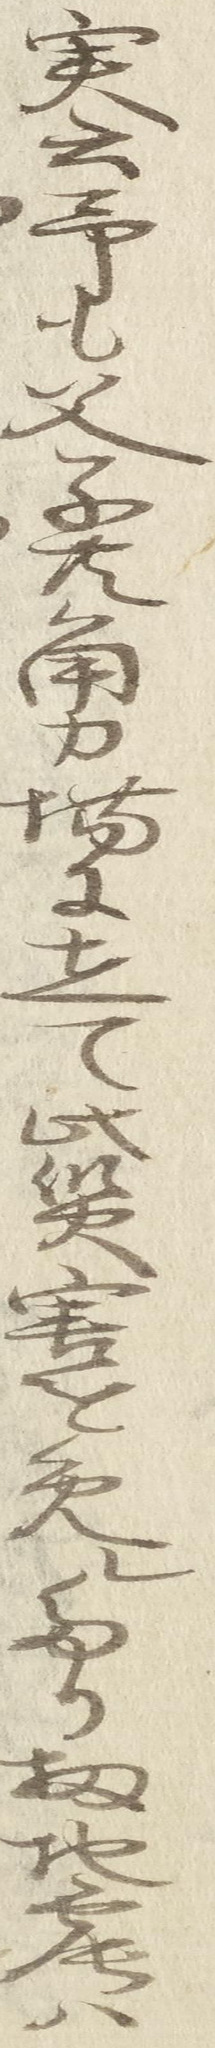実云予も父子共角力場に在て此災害を免れたり扨地震ハ
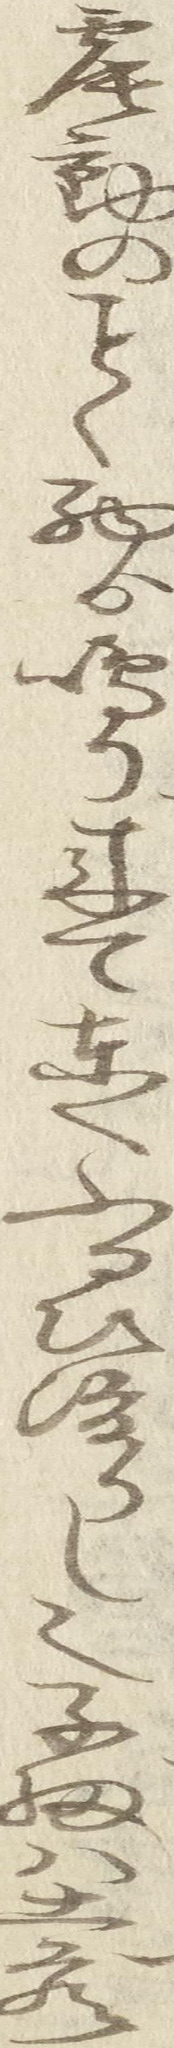震動のことく西より鳴り来て東へふるひ渡りし也子細ハ土蔵
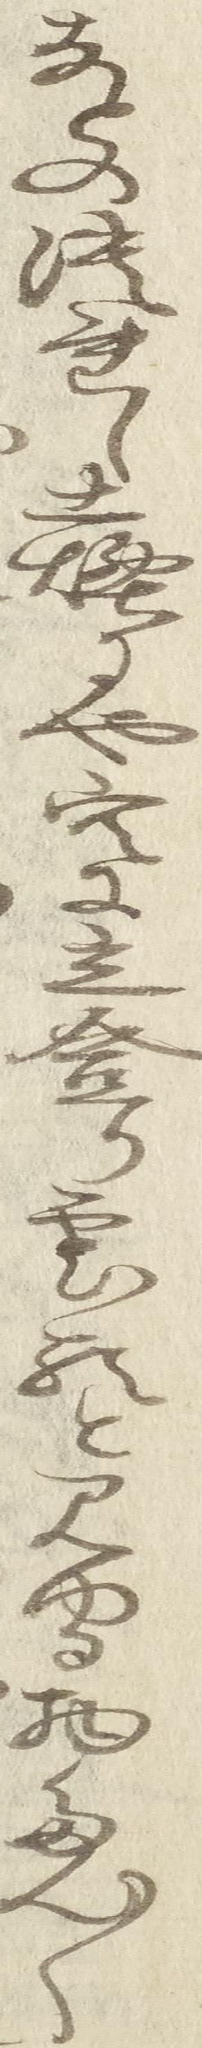なとの潰れし土煙にや空に立登り雲歟と見ゆる物たん〳
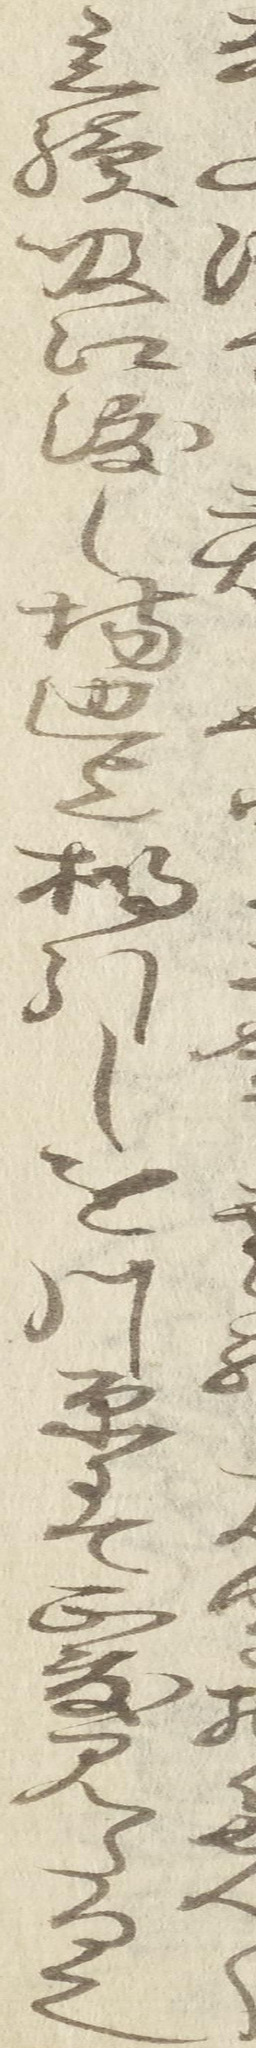立続吸江渡し場辺迄棚引しを川原にて正敷見たる也
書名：地震記　上
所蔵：東京大学地震研究所図書室 Earthquake Research Institute Library, The University of Tokyo, JAPAN
